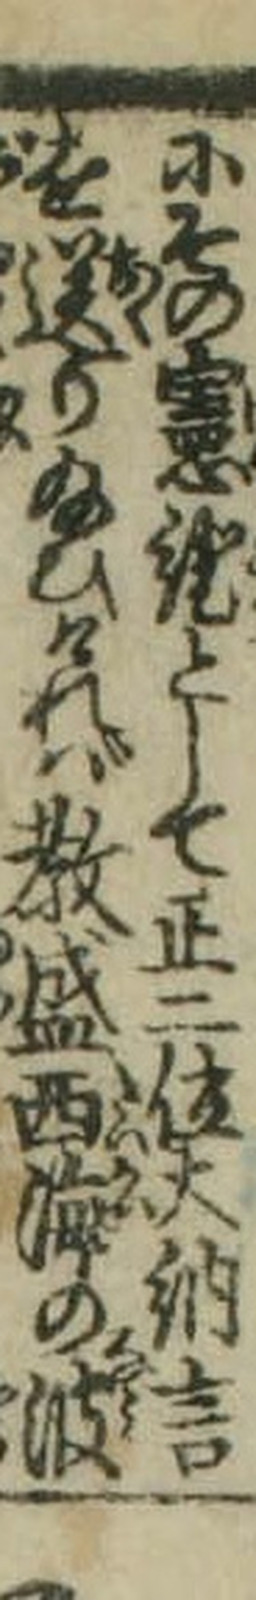を送り給ひければ教盛西海の波
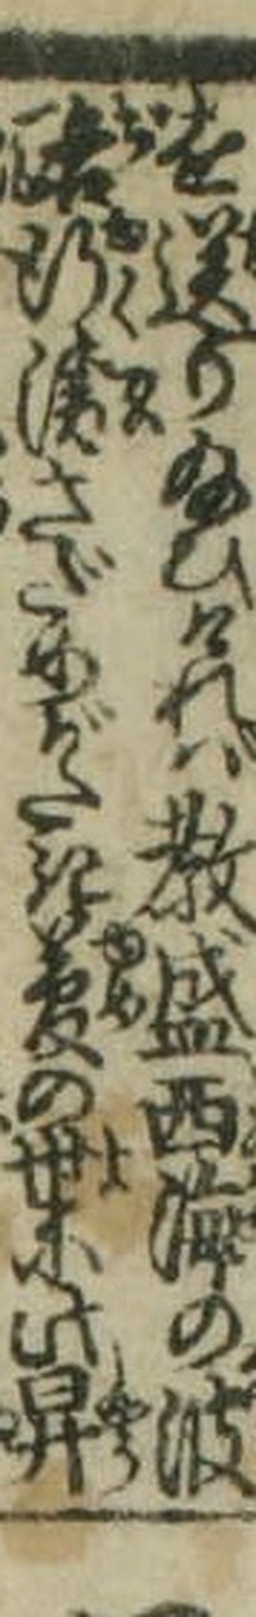路行衛さだめがたき夢の世に此昇
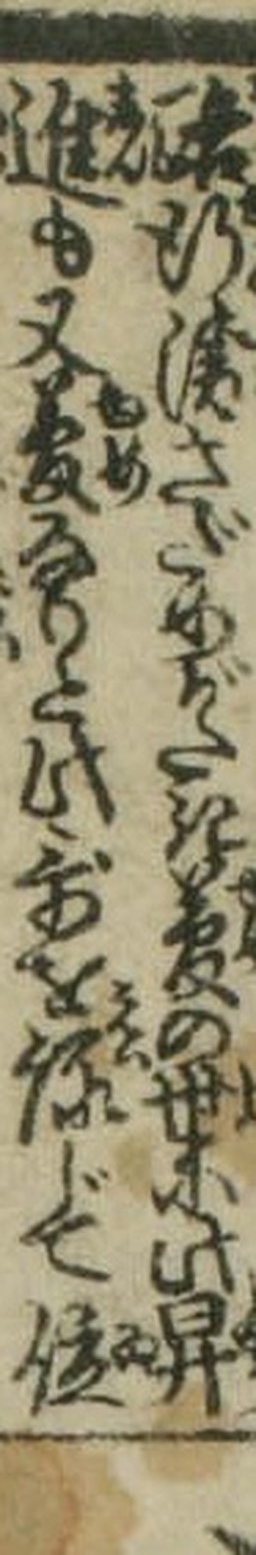進も又夢なりと此哥を詠じて位
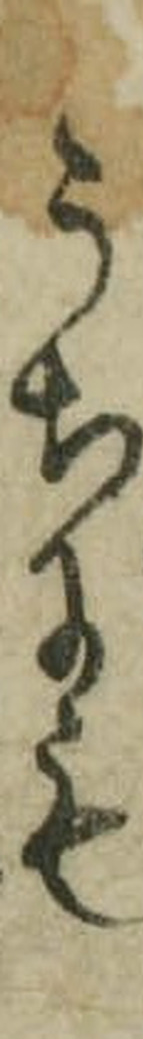うちにも
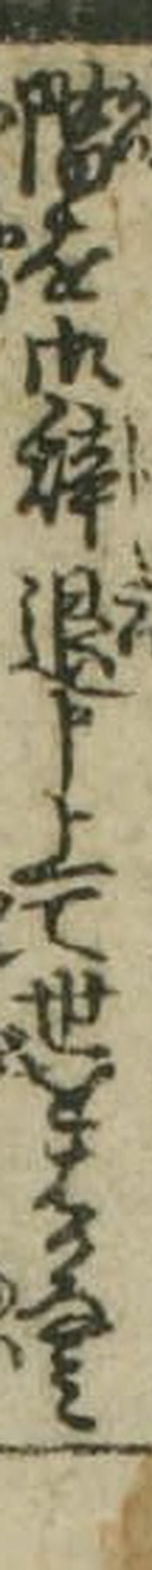階を御辞退申上て世をはかなみ
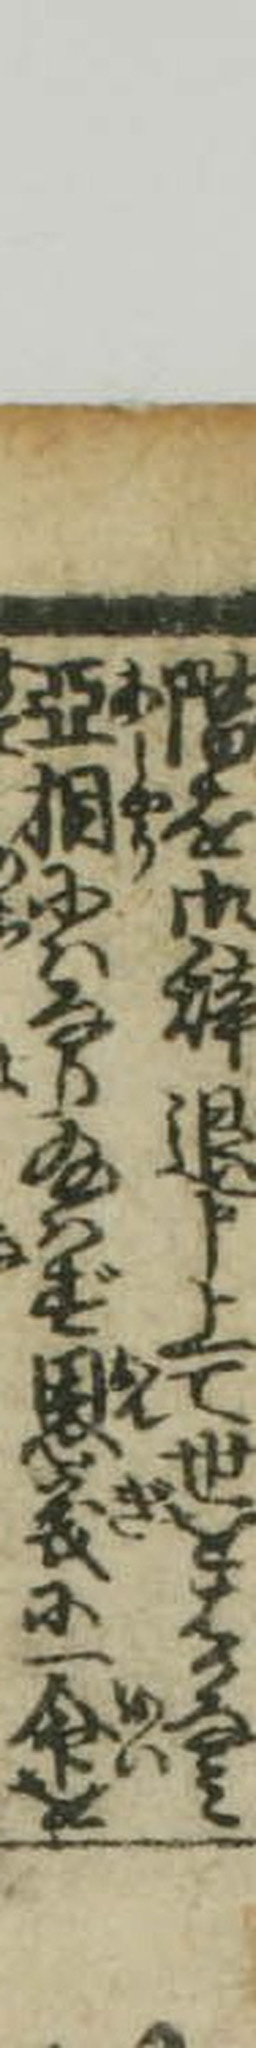亞相にはなり給はず恩義に一命を
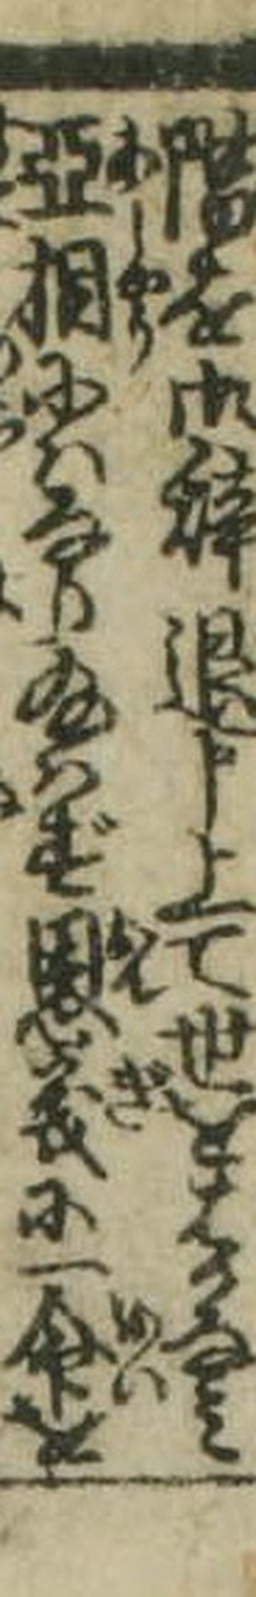亞相にはなり給はず恩義に一命を
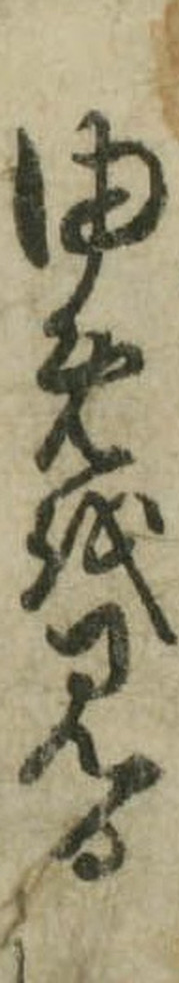ゆめを見る
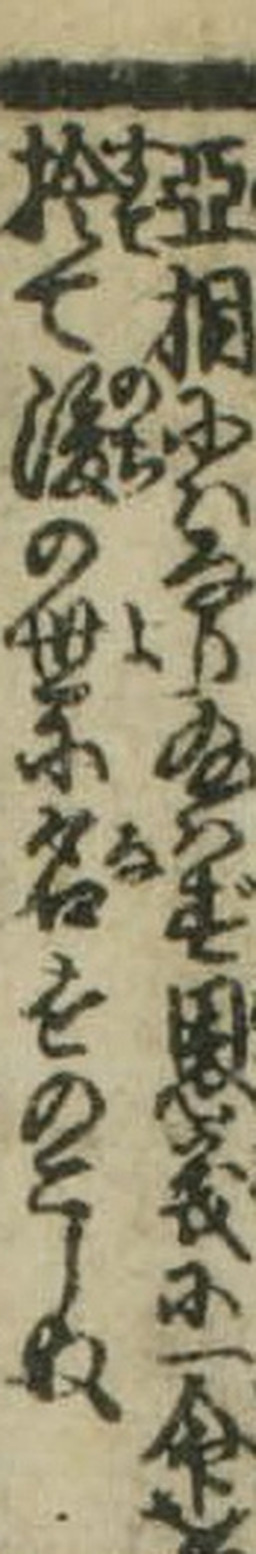捨て後の世に名をのこしぬ
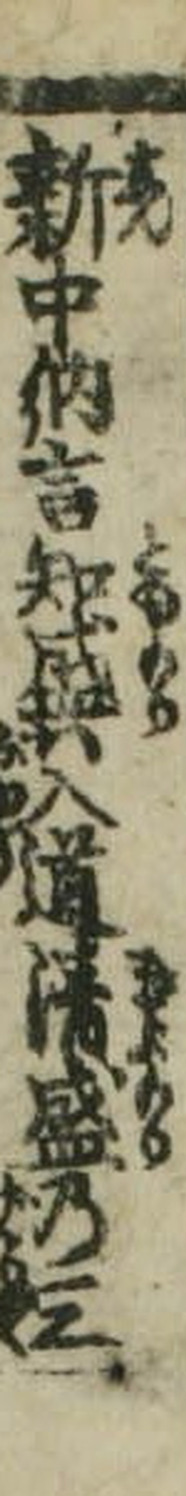新中納言知盛は入道清盛の三
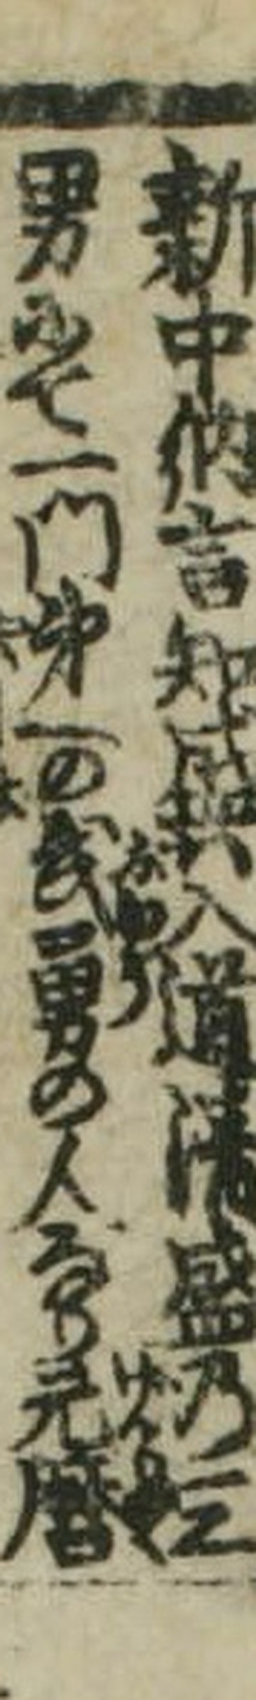男にて一門第一の武勇の人なり元暦
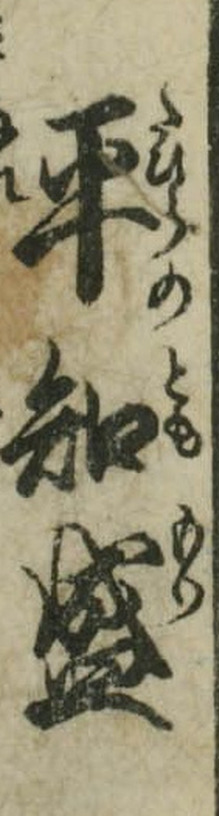平知盛
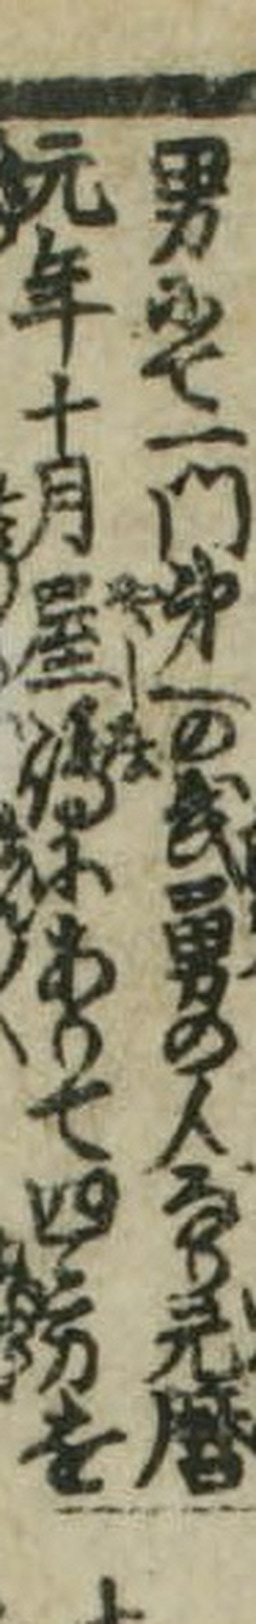元年十月屋嶋にありて四方を
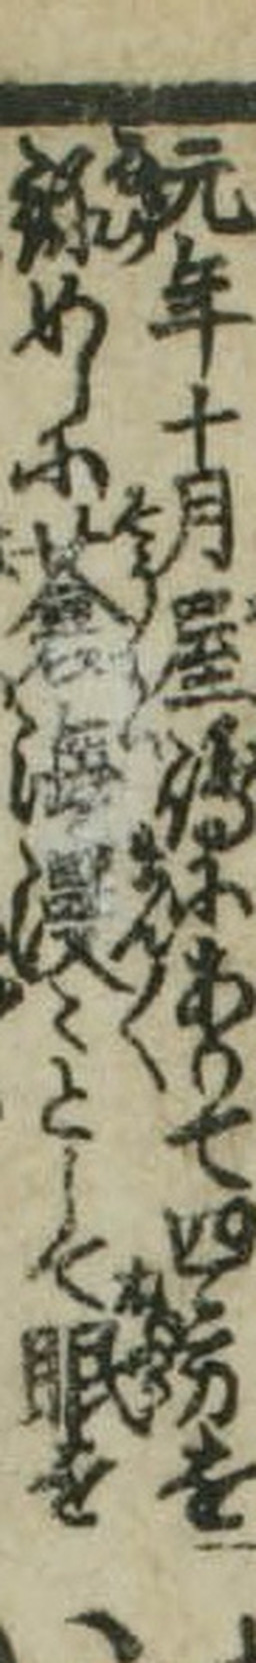詠めしに蒼海漫々として眠を
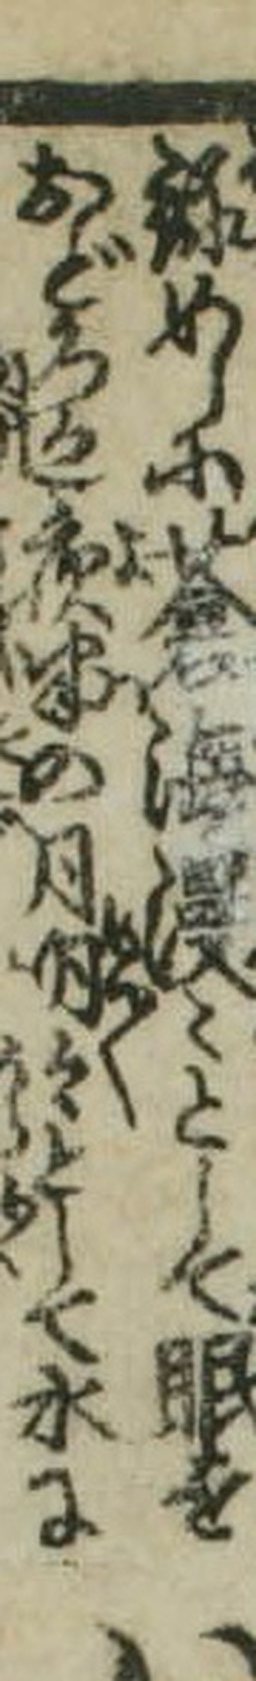おどろかし夜半の月明々として水に
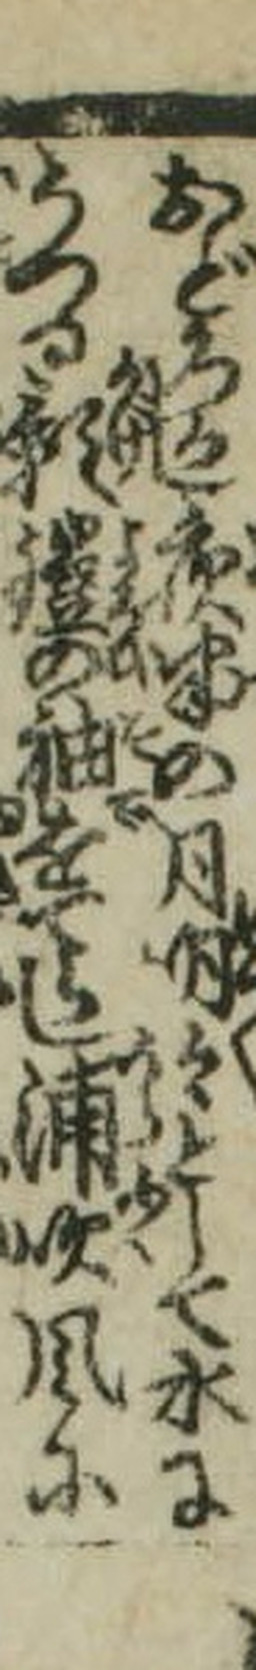うつる影鎧の袖をてらし浦吹風に
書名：續英雄百人一首
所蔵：東京学芸大学附属図書館
